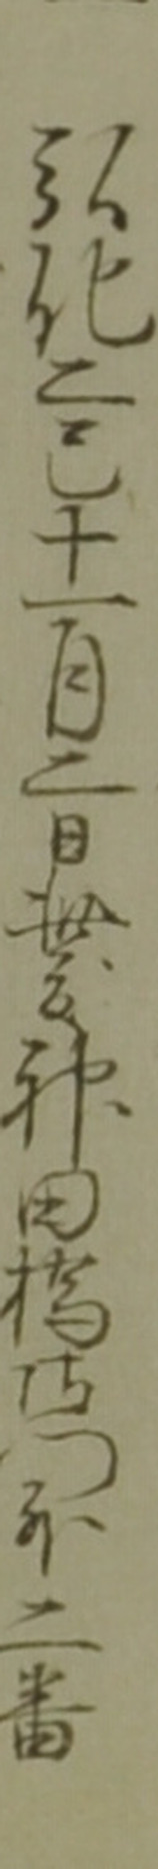一弘化二巳十一月二日此度神田橋御門外二番

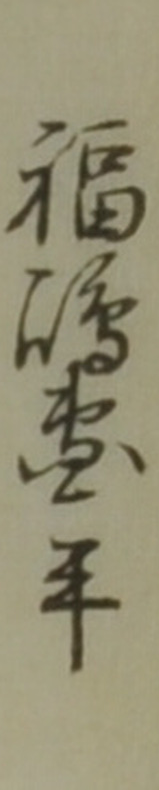福嶋團平
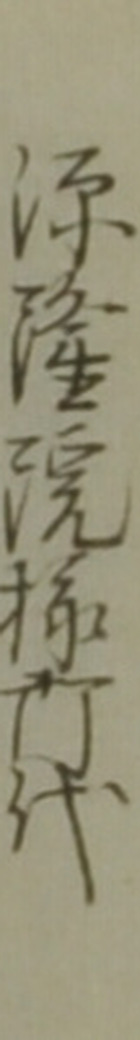源隆院様御代
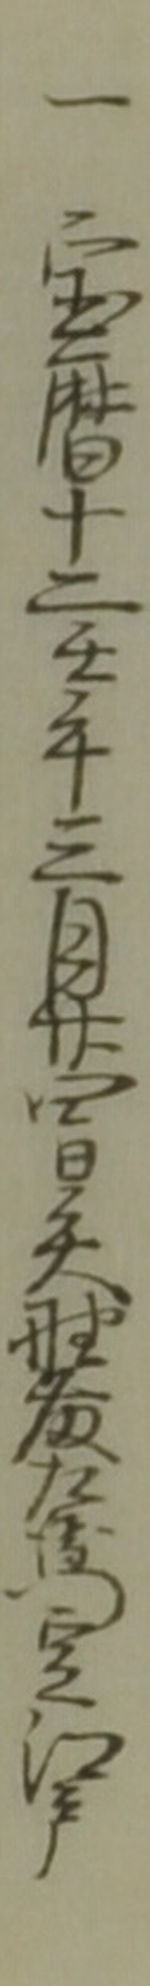一宝暦十二壬午三月廿四日矢野藤左衛門定江戸
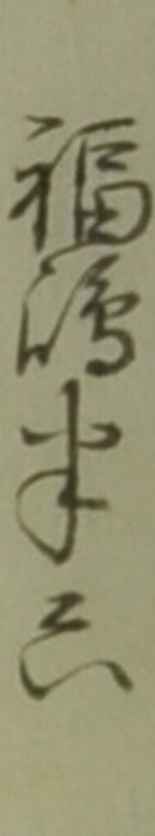福嶋半六

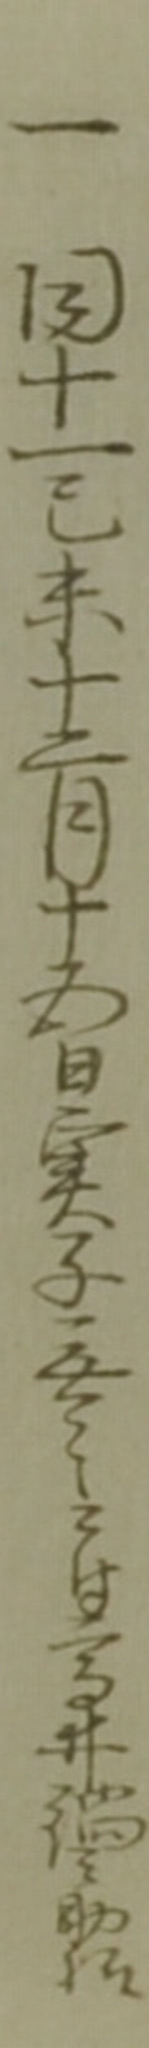一同十一己未十二月十五日実子無之ニ付高井鍋之助様
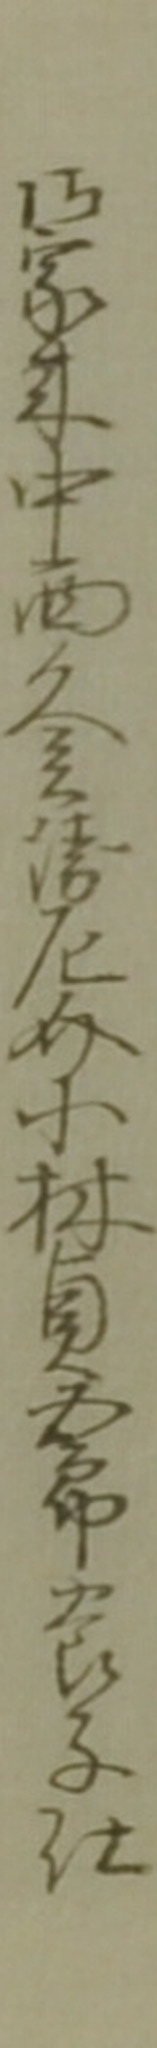御家来中西久兵衛厄介小林貞五郎養子仕
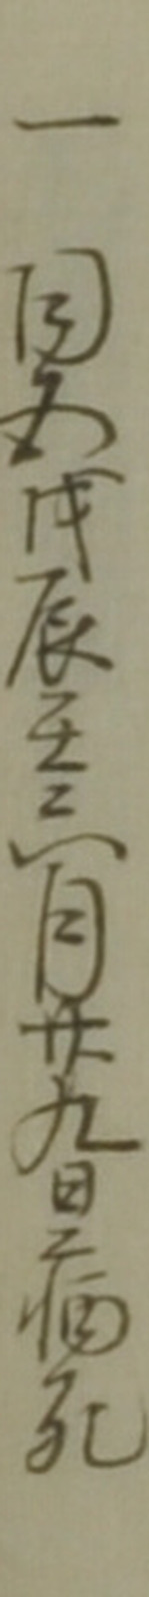一同五戌辰閏六月廿九日病死
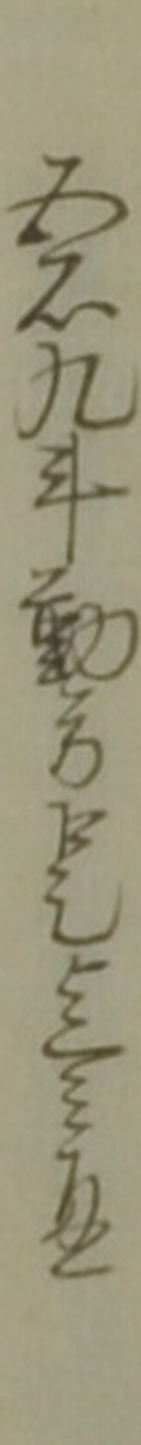五石九斗勤方是迄之通
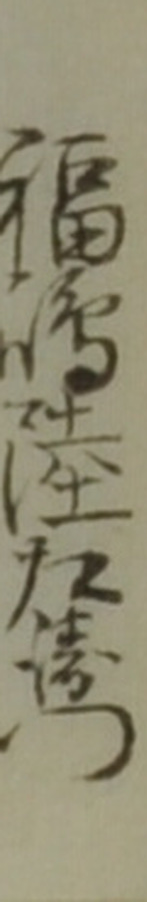福嶋陸左衛門
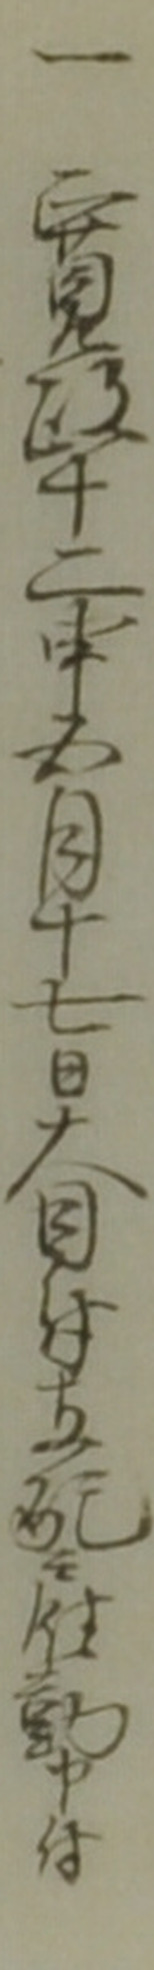一寛政十二申五月十七日大目付支配雇勤申付
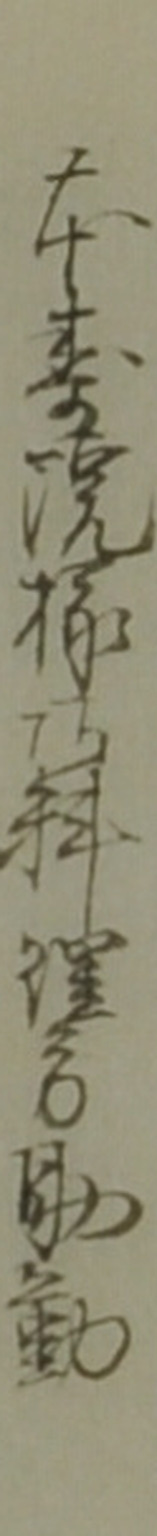本寿院様御料理方助勤
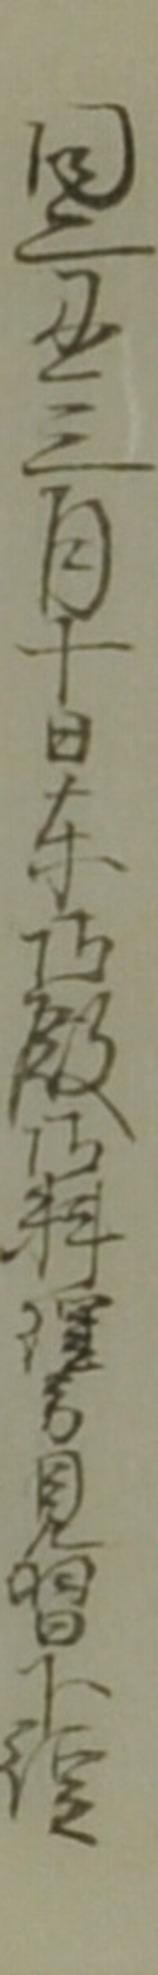一同二丑三月十日東御殿御料理方見習下錠
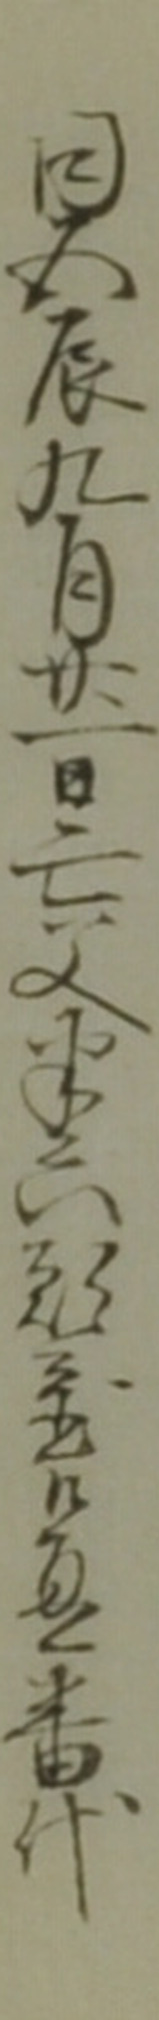一同五辰九月廿一日亡父半六願置候通番代
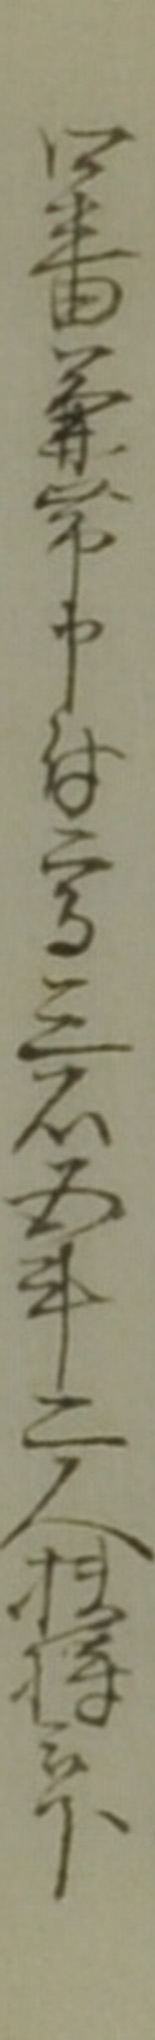口番兼帯申付高三石五斗二人扶持被下
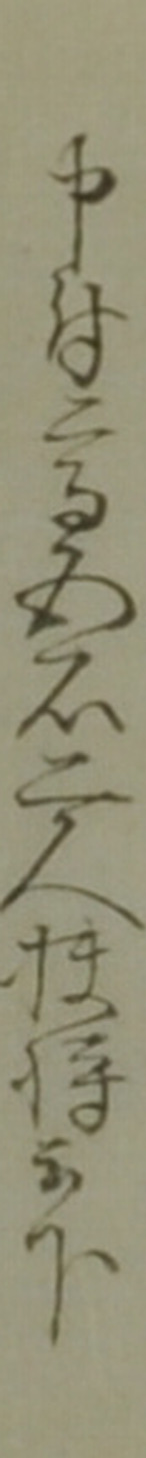申付高五石二人扶持被下
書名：無足諸士勤仕録（七）
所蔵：伊那市立高遠町図書館・合同会社AMANE
